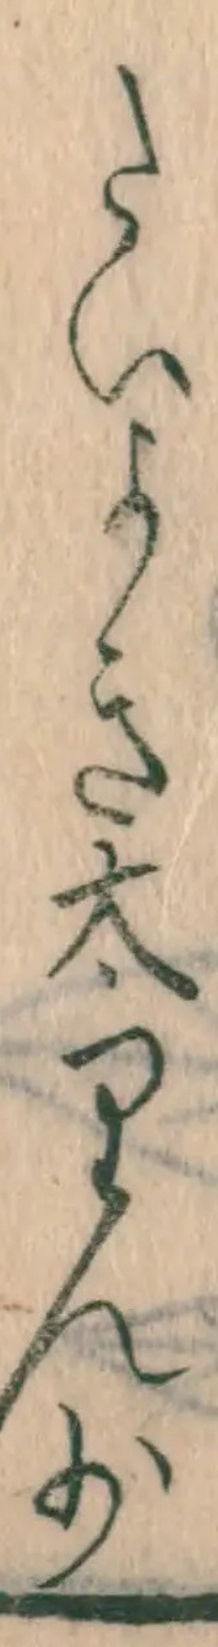たいよき太りん少
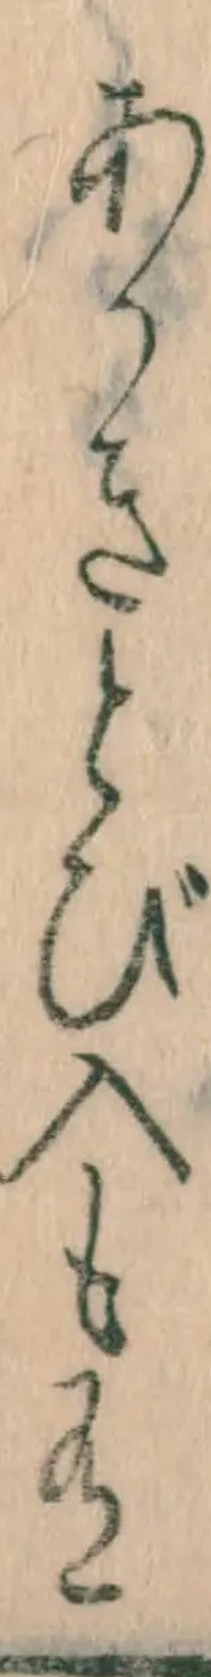あかきとび入も有
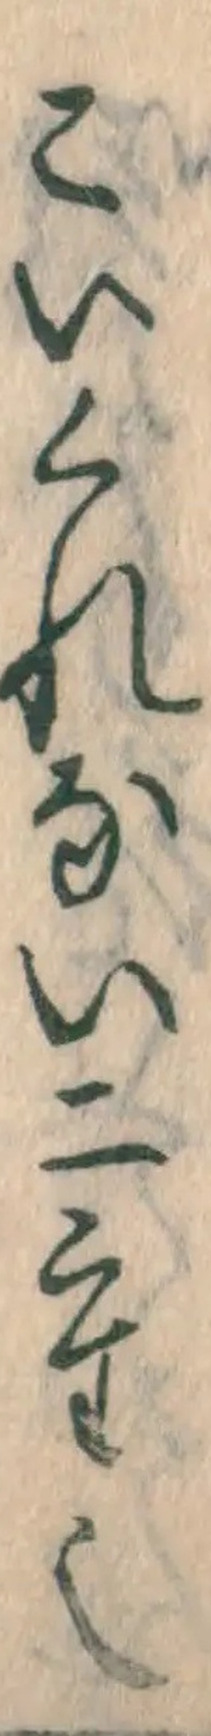こいくれない二重也
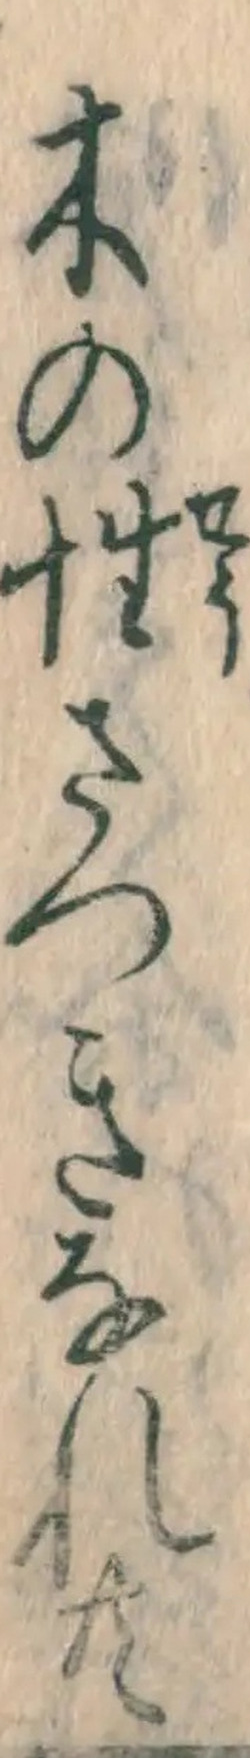木の性さつきなれ共
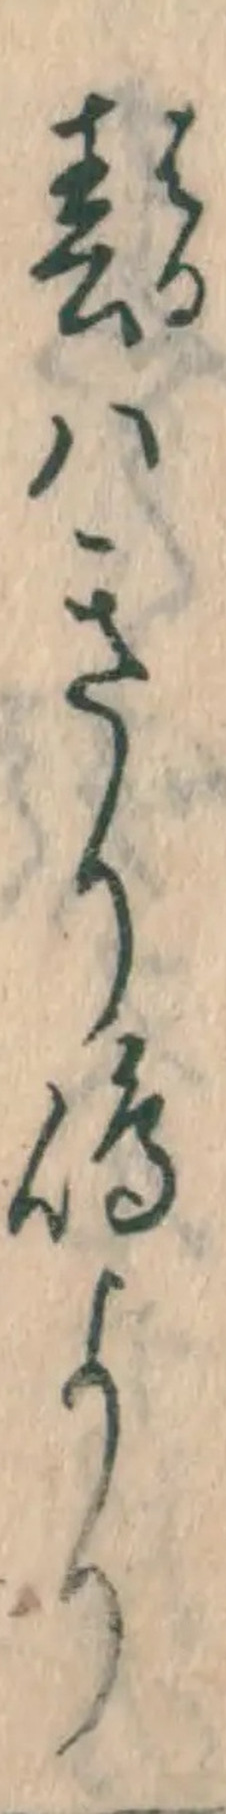春はきり嶋より

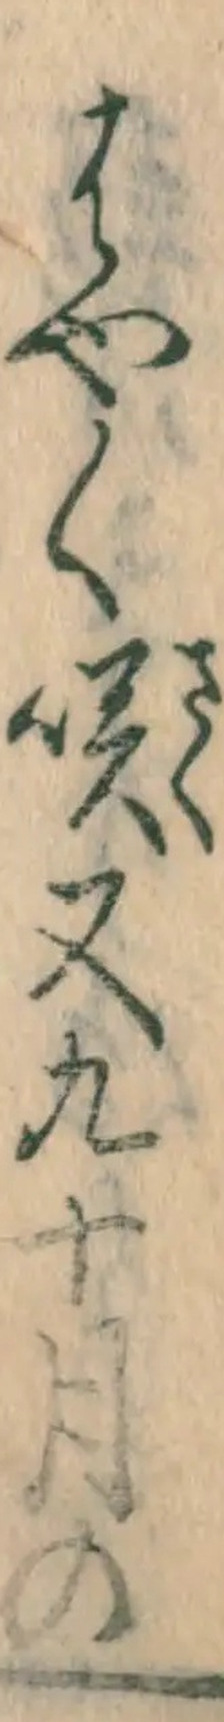はやく咲又九十月の
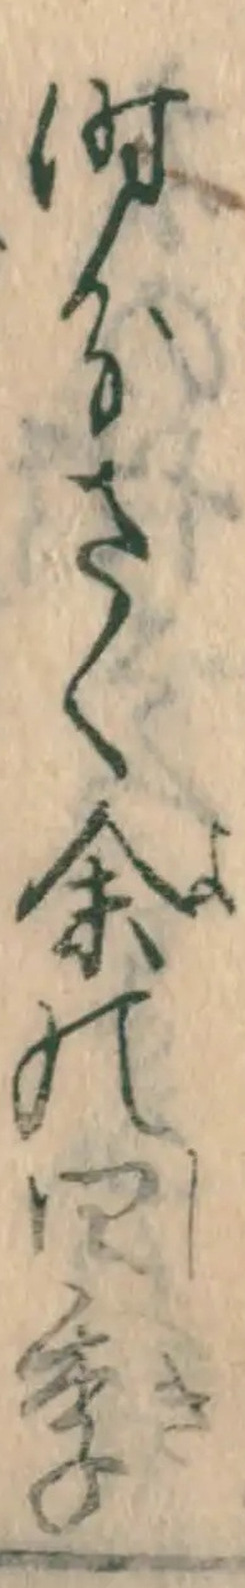時分さく余の四季
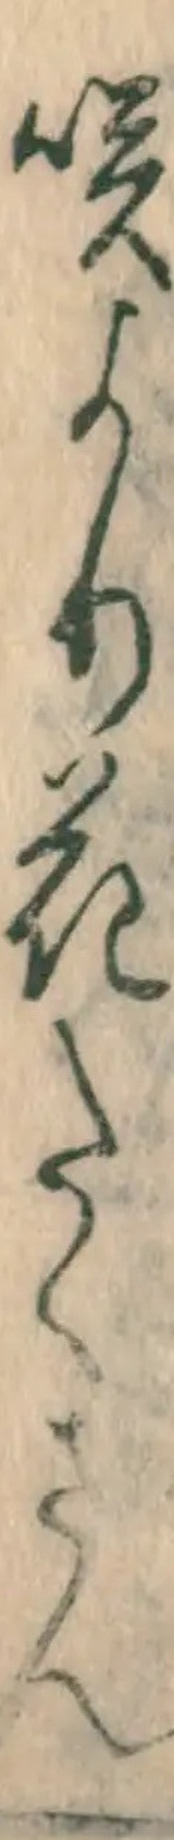咲より花たくさん
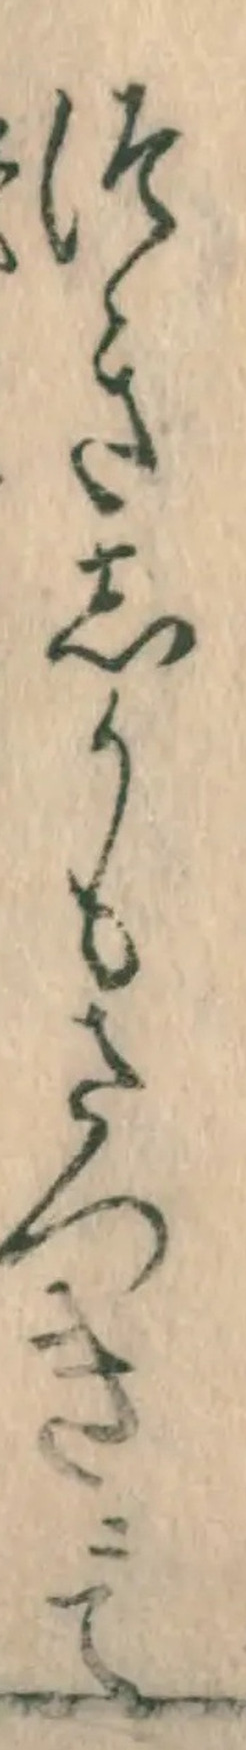つきしかもさつき
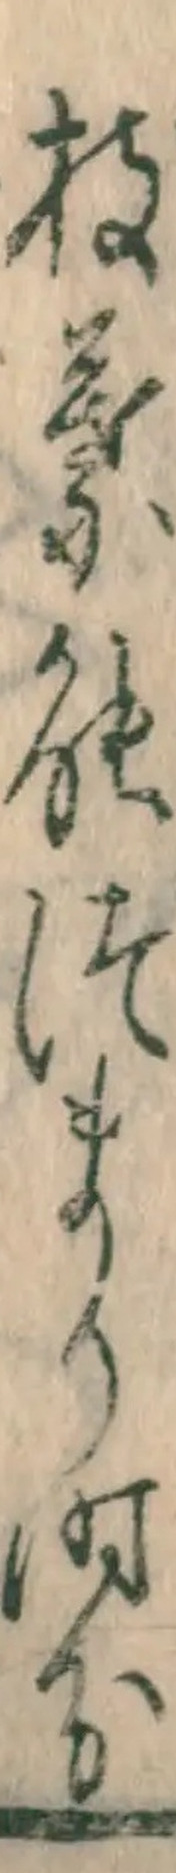枝葉能つまり時分
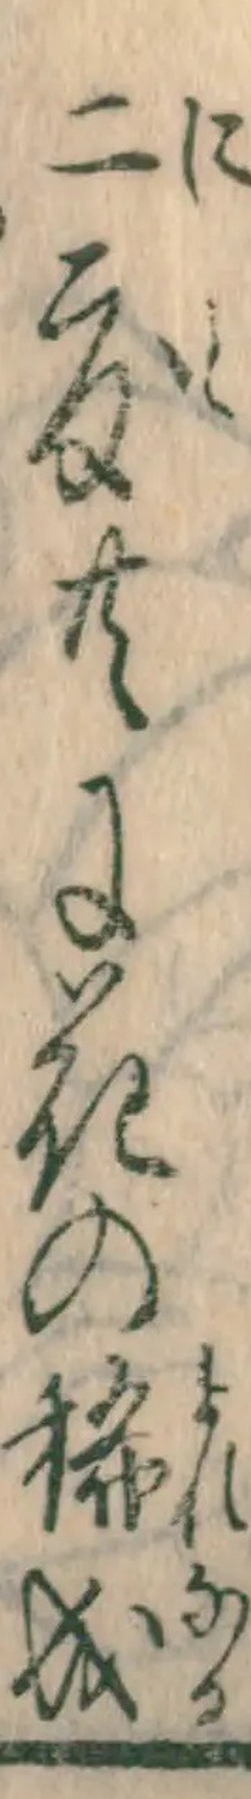二度共に花の稀成
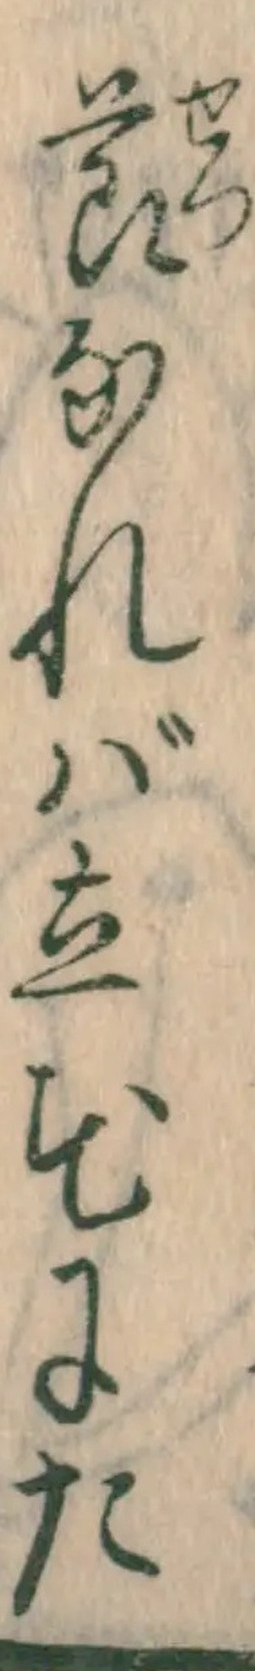節なれば立花にた
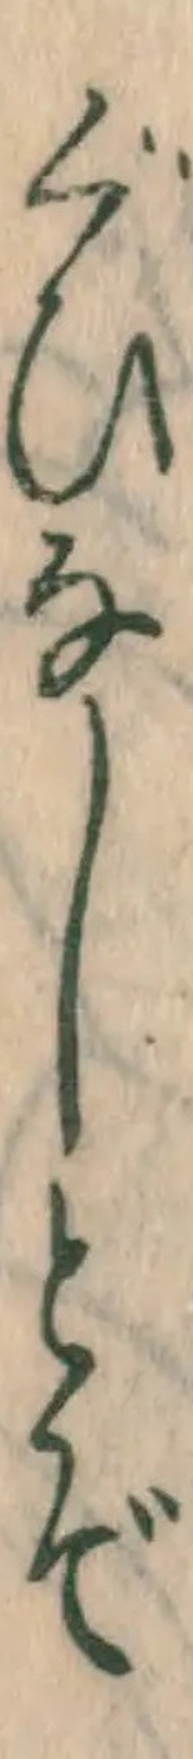ぐひなしとぞ
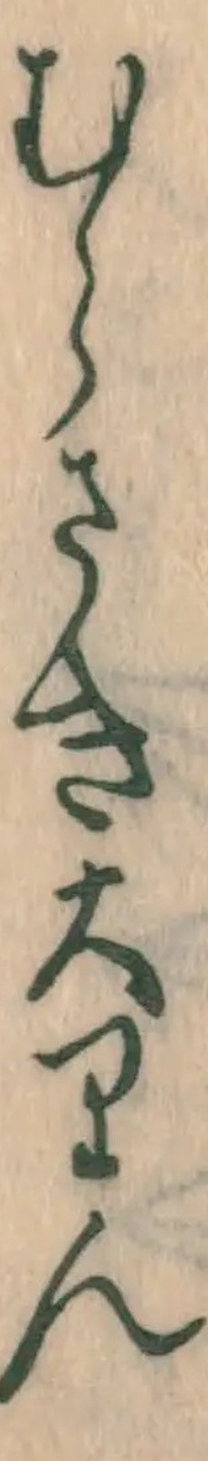むらさき大りん
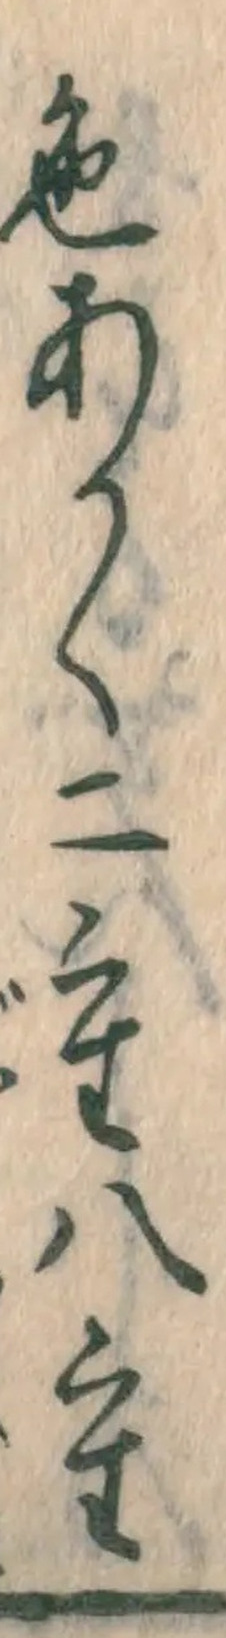色あかく二重八重
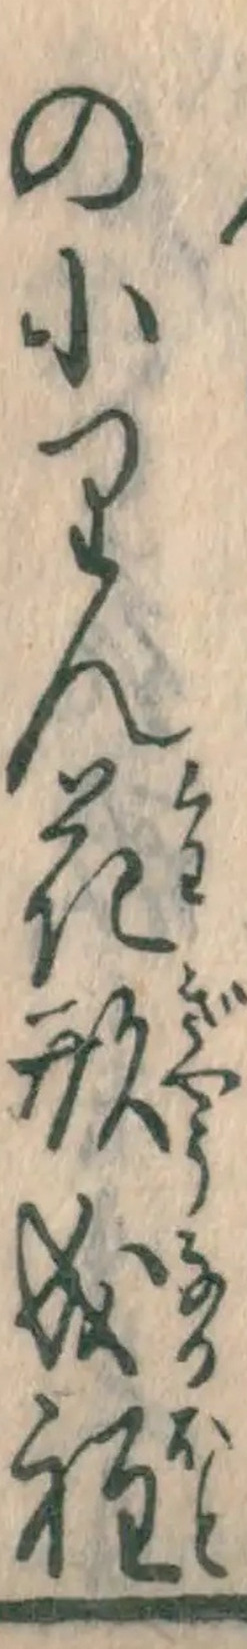の小りん花形成程
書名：錦繍枕 5巻. [5]
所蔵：国立国会図書館 National Diet Library, JAPAN
